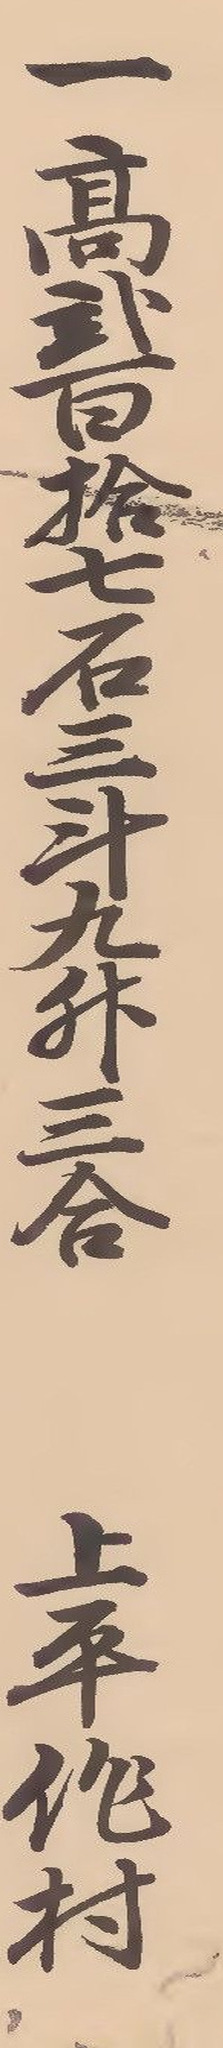一高弐百拾七石三斗九升三合上平作村
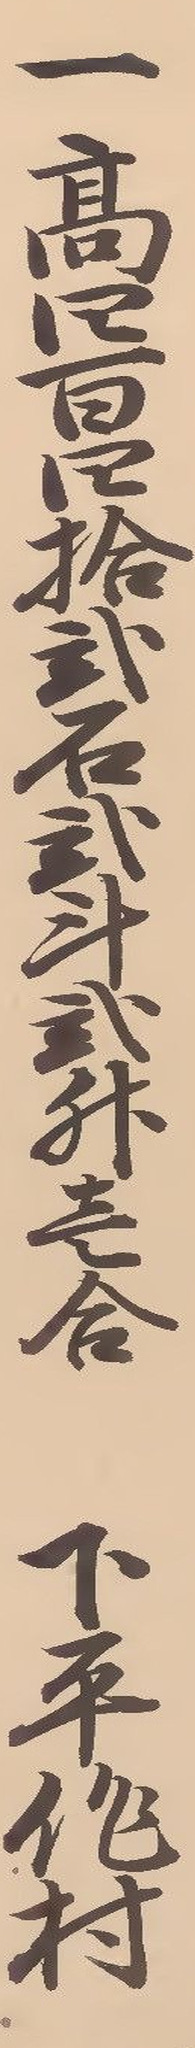一高四百四拾弐石弐斗弐升壱合下平作村
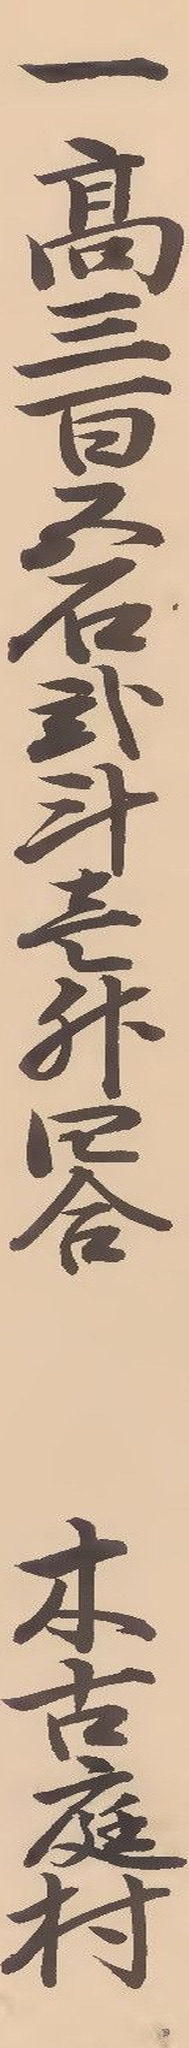一高三百五石弐斗壱升四合木古庭村
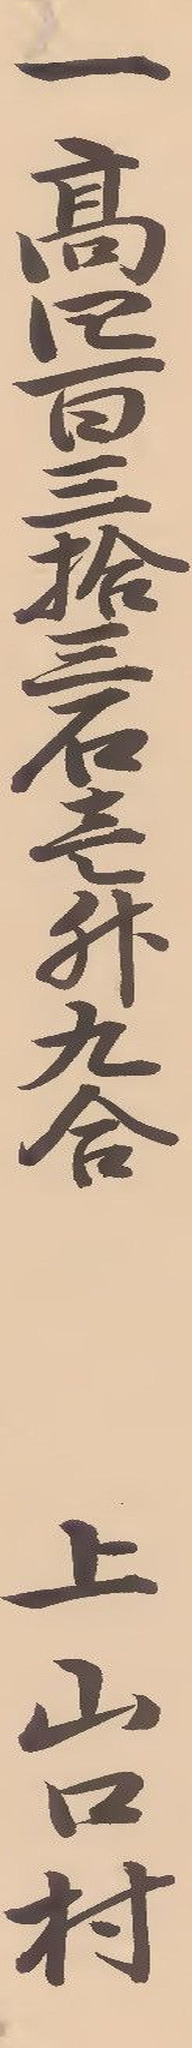一高四百三拾三石壱升九合上山口村
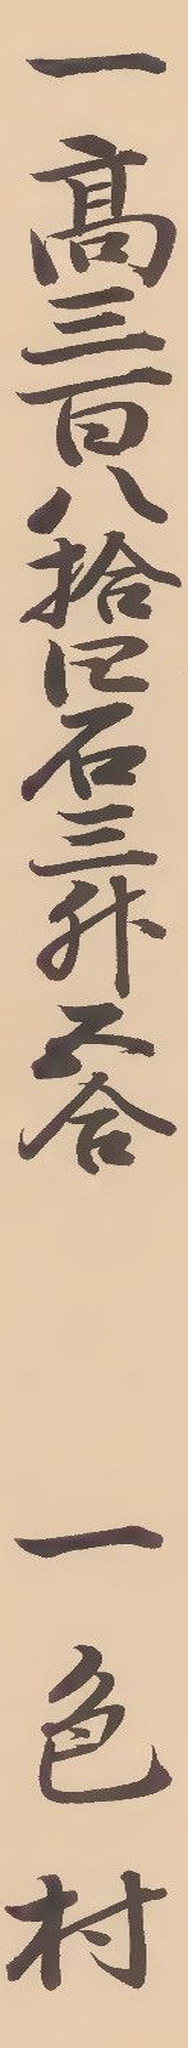一高三百八拾四石三升五合一色村

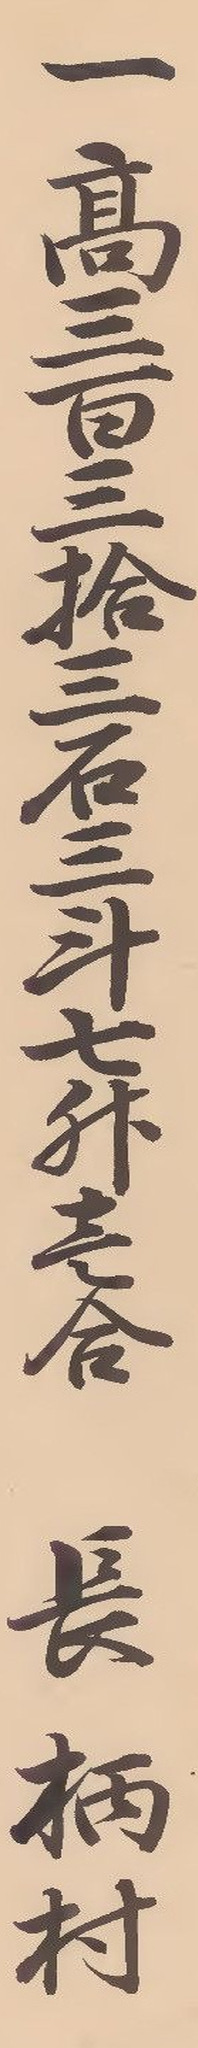一高三百三拾三石三斗七升壱合長柄村
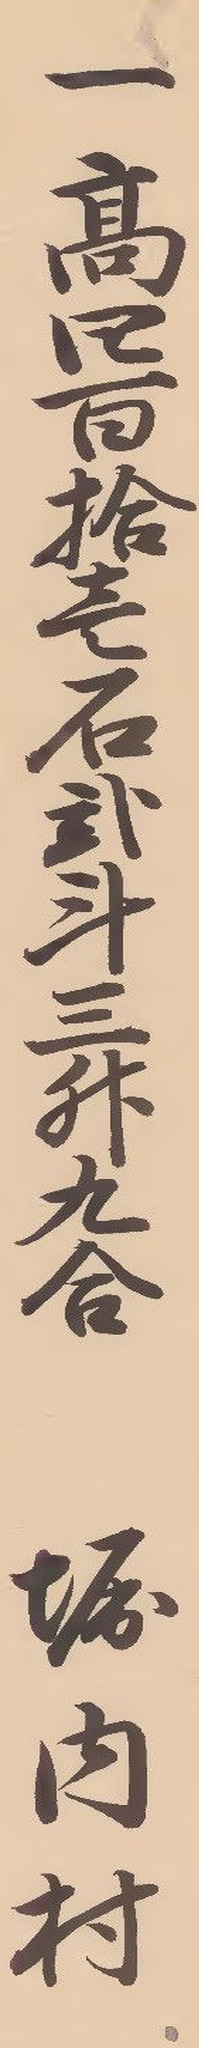一高四百拾壱石弐斗三升九合堀内村
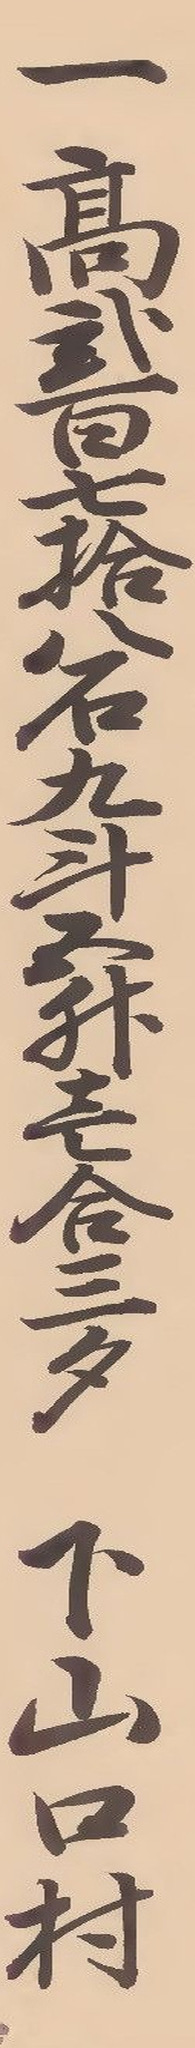一高弐百七拾八石九斗五升壱合三勺下山口村
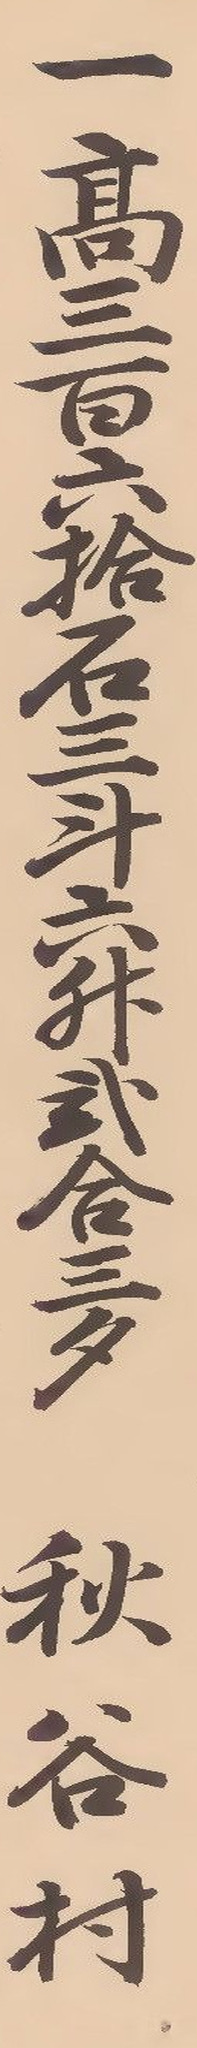一高三百六拾石三斗六升弐合三勺秋谷村
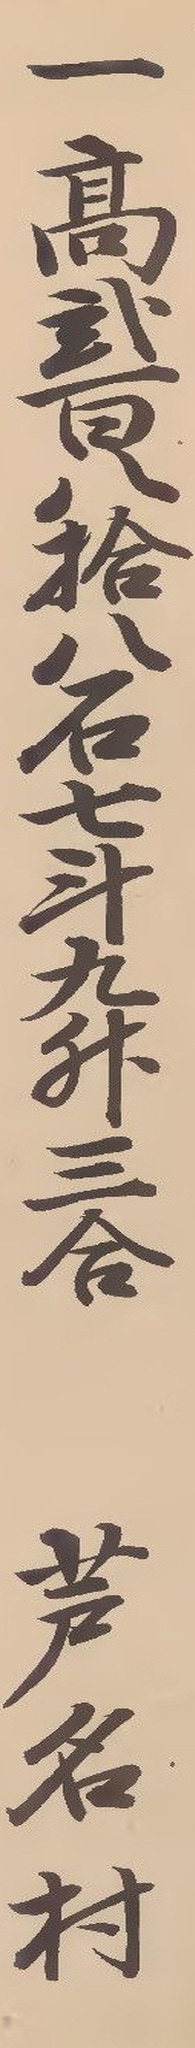一高弐百八拾八石七斗九升三合芦名村
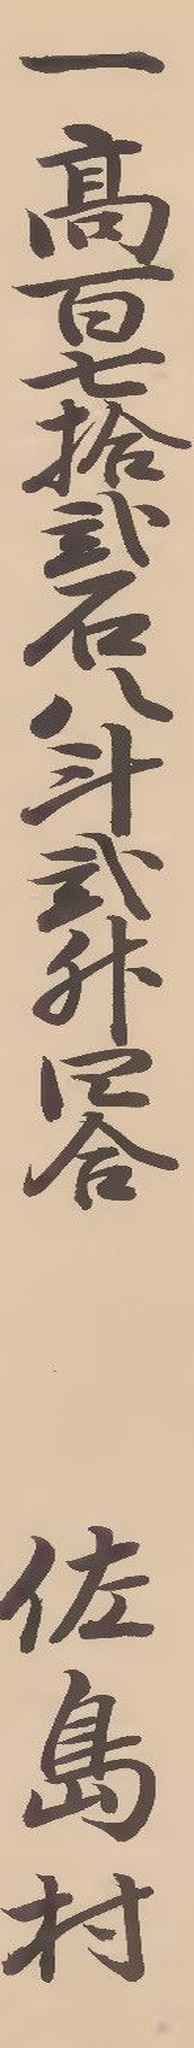一高百七拾弐石八斗弐升四合佐島村
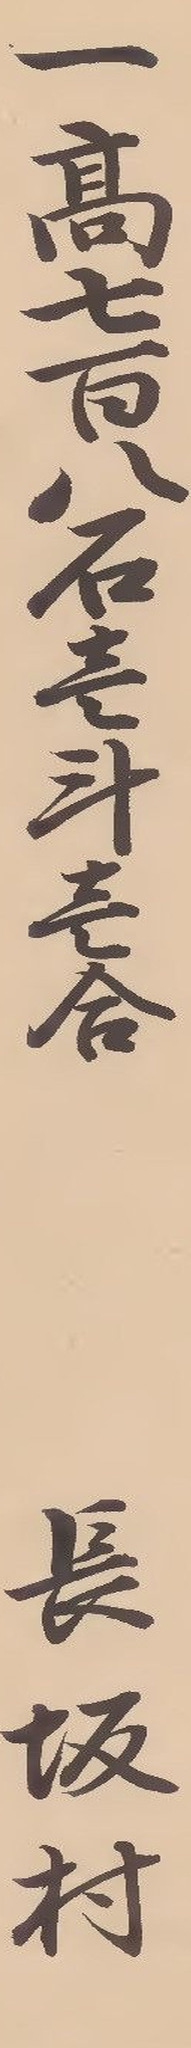一高七百八石壱斗壱合長坂村

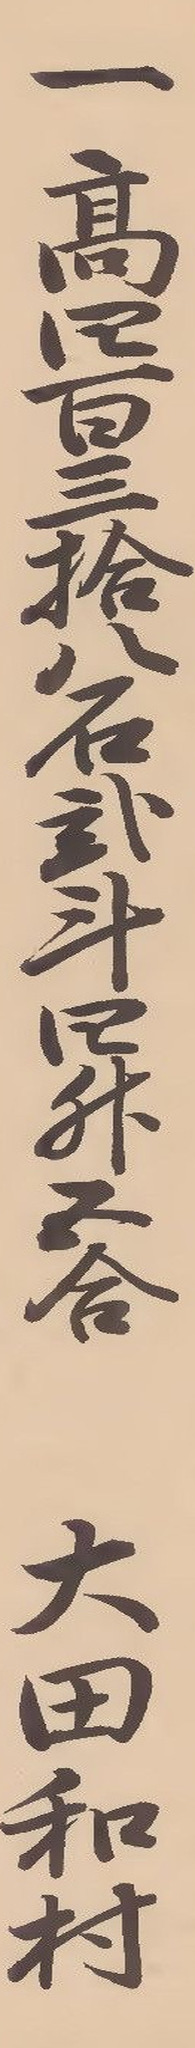一高四百三拾八石弐斗四升五合大田和村
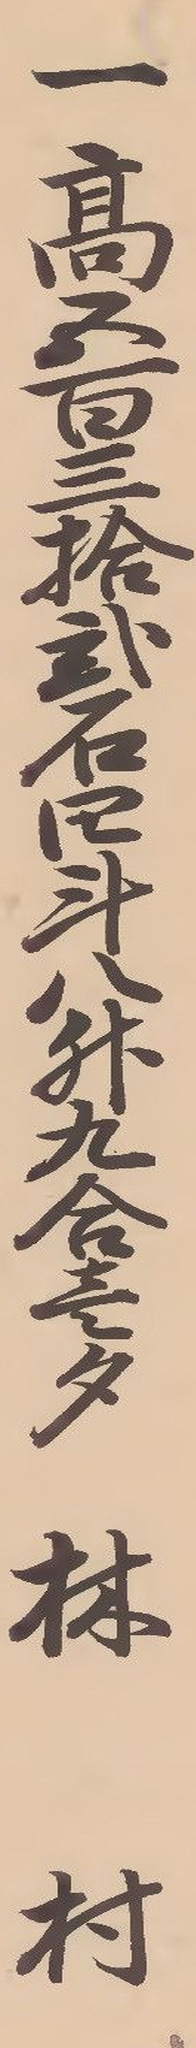一高五百三拾弐石四斗八升九合壱勺林村
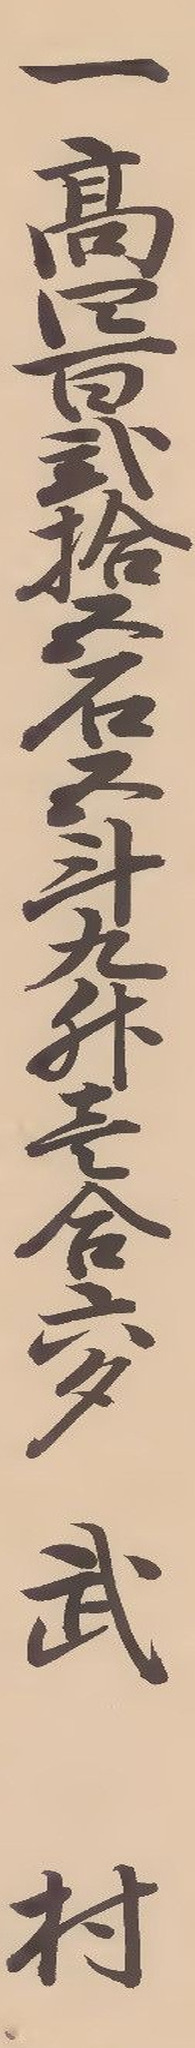一高四百弐拾五石五斗九升壱合六勺武村
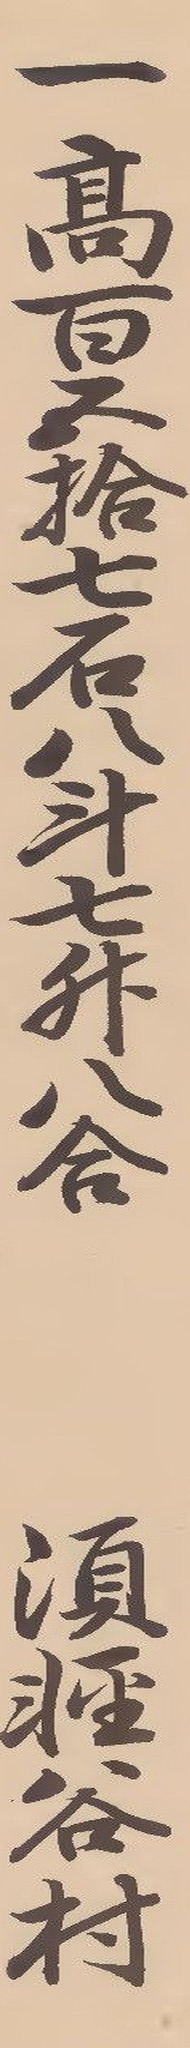一高百五拾七石八斗七升八合須軽谷村
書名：相模国郷帳
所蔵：国立公文書館 National Archives of Japan
